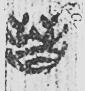晉
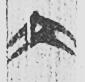文
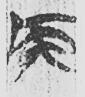侯
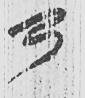乃
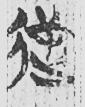逆
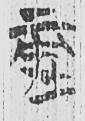坪
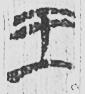王
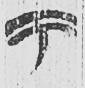于
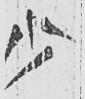少
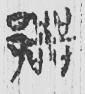鄂
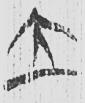立
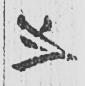之
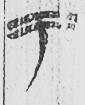于
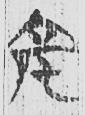京
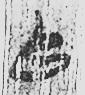𠂤
